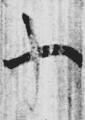七
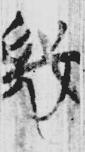幾（機）
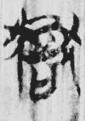獄
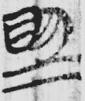則（則）
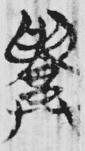興
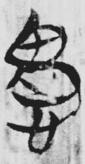○（威）
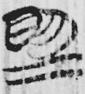則（則）
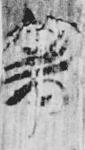民
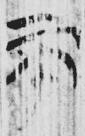不
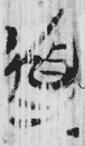道
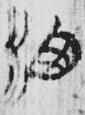洒
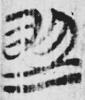則（則）
